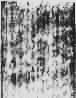冬（冬）
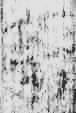○（夕）
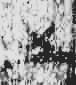之
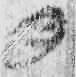月
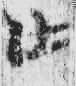甲
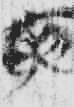寅
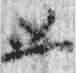之
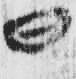日
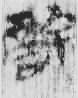○（舒）
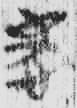快
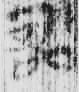訟
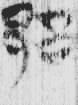郘
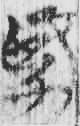○（賢）
